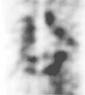公
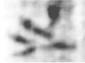之
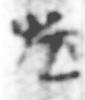○（左）
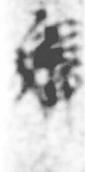○（服）
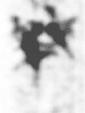牧
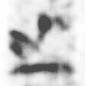之
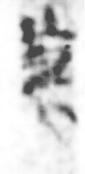黃
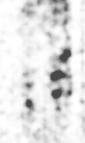爲
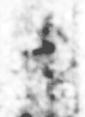○（右）
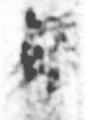○（服）
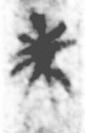朱
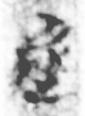○（路）
